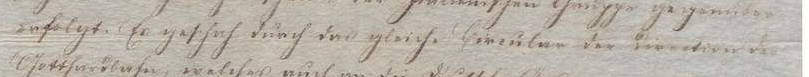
erfolgt. Es geschah durch das gleiche Circular der Direction der
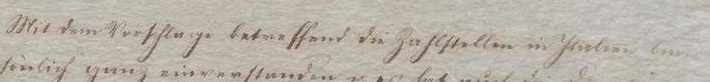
Mit dem Vorschlage betreffend die Zahlstellen in Italien bin
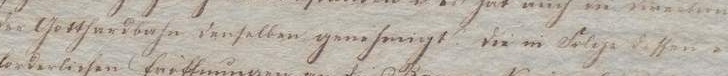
der Gotthardbahn denselben genehmigt. Die in Folge dessen er-
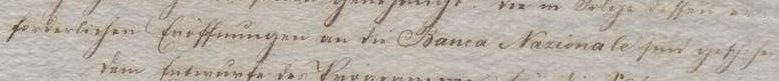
forderlichen Eröffnungen an die Banca Nazionale sind geschehen.
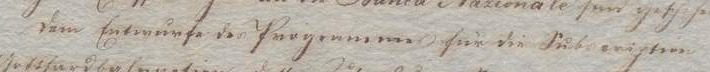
Dem Entwurfe des Programmes für die Subscription
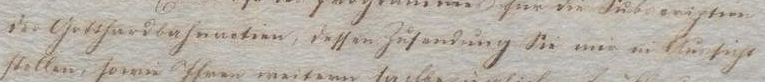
der Gotthardbahnactien, dessen Zusendung Sie mir in Aussicht
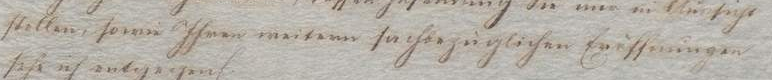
stellen, sowie Ihren weitern sachbezüglichen Eröffnungen
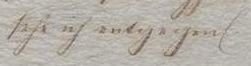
sehe ich entgegen.
